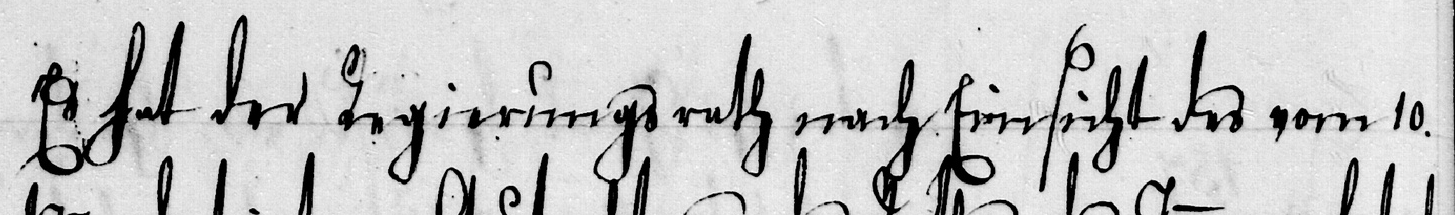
Es hat der Regierungsrath nach Einsicht des vom 10.
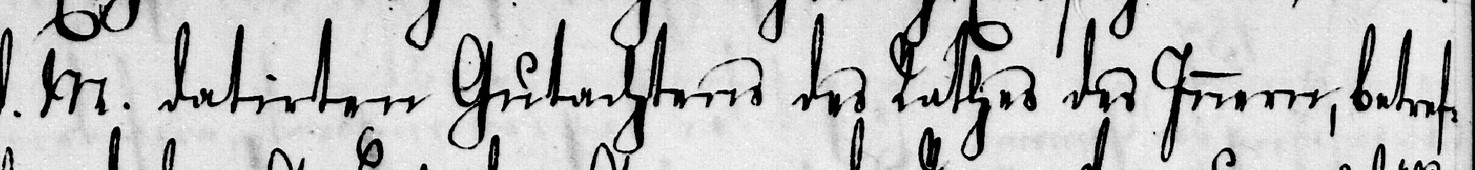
M. datirten Gutachtens des Rathes des Innern, betre¬
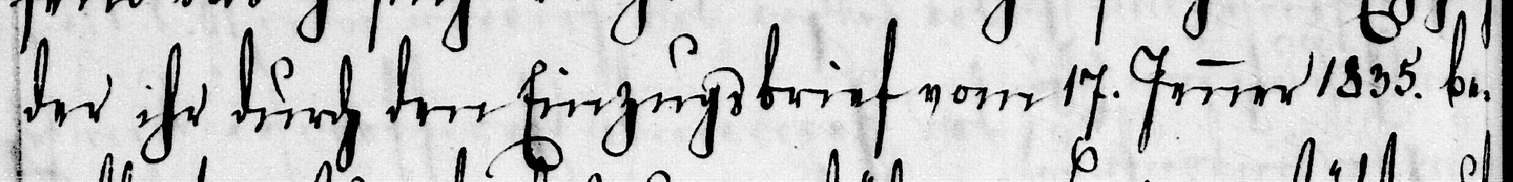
der ihr durch den Einzugsbrief vom 17. Jenner 1835. be¬
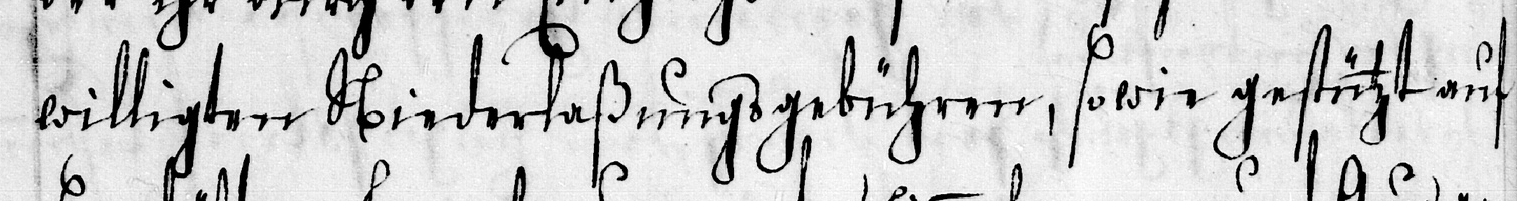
willigten Niederlaßungsgebühren, sowie gestützt auf
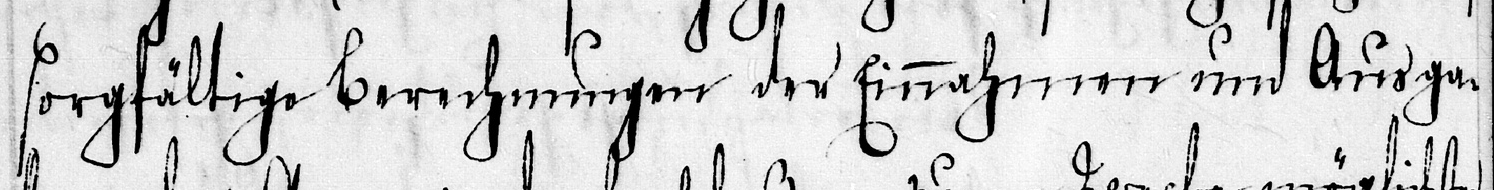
sorgfältige Berechnungen der Einnahmen und Ausga¬
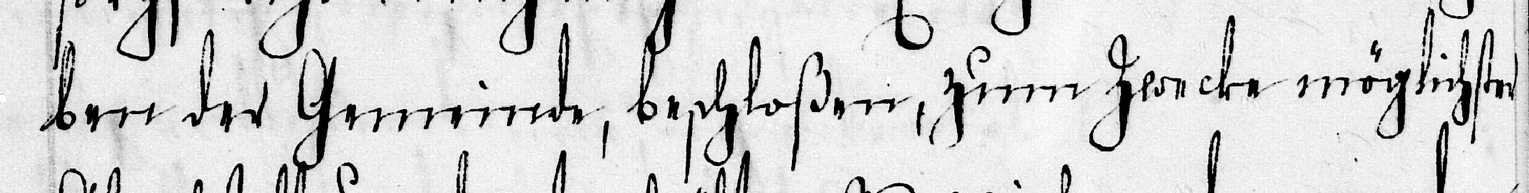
ben der Gemeinde, beschloßen, zum Zwecke möglichst¬
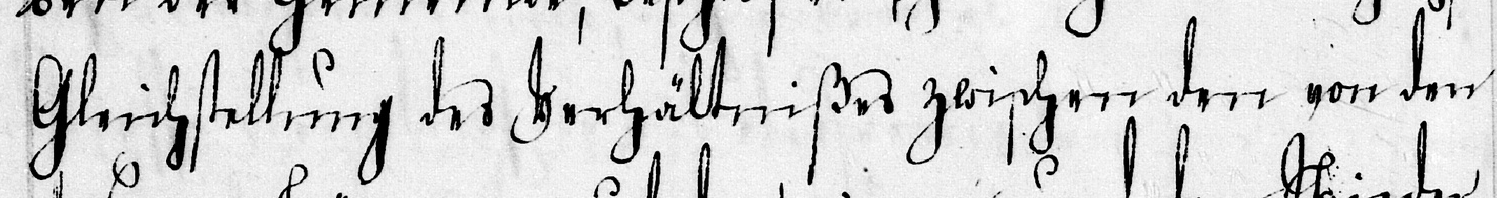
Gleichstellung des Verhältnißes zwischen den von den
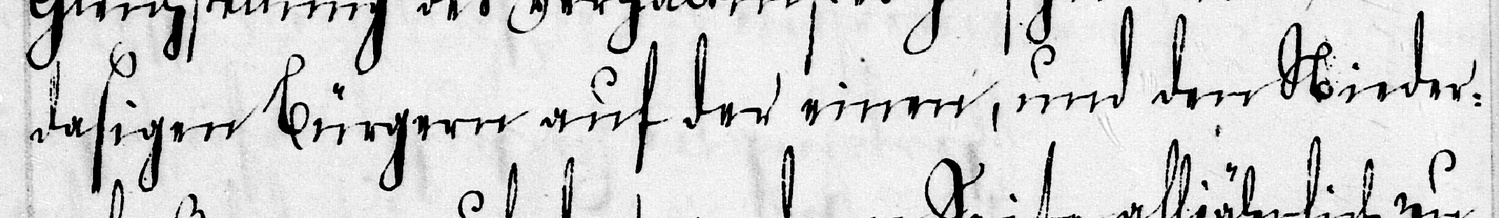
dasigen Bürgern auf der einen, und den Nieder¬
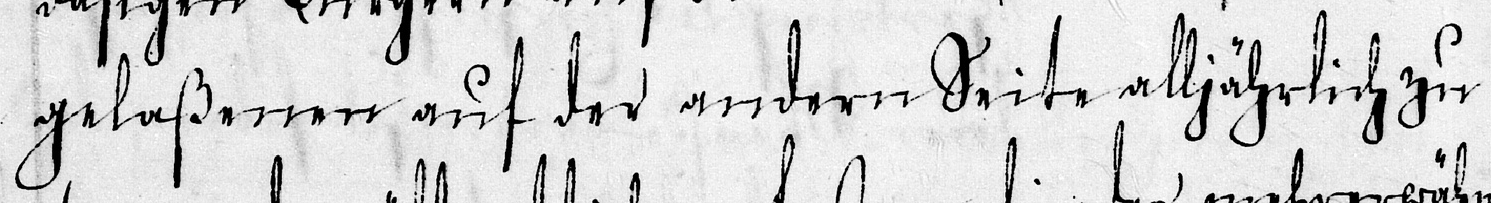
gelaßenen auf der andern Seite alljährlich zu
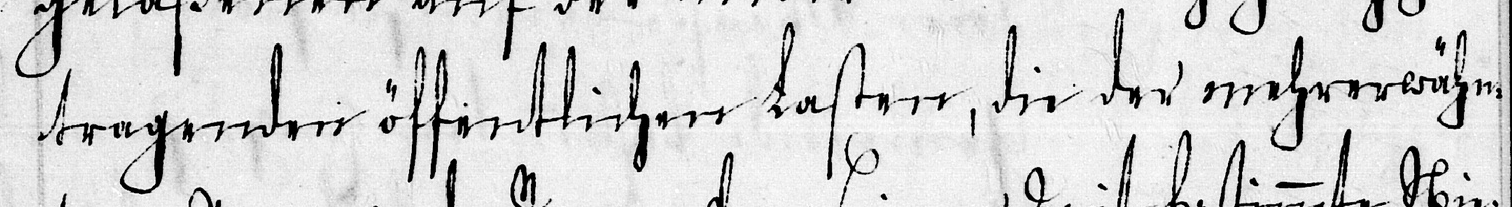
tragenden öffentlichen Lasten, die der mehrerwähn¬
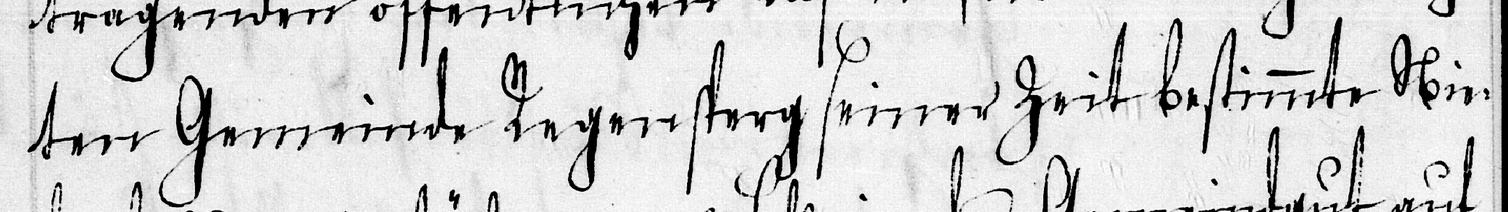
ten Gemeinde Regensperg seiner Zeit bestimmte Nie¬
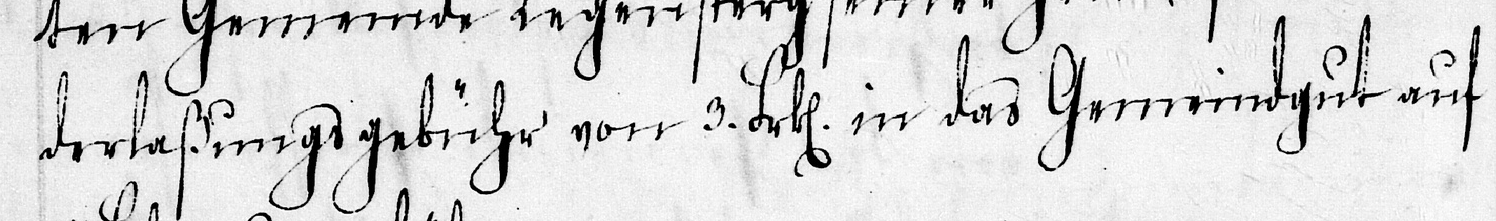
derlaßungsgebühr von 3. Frk[en]. in das Gemeindgut auf
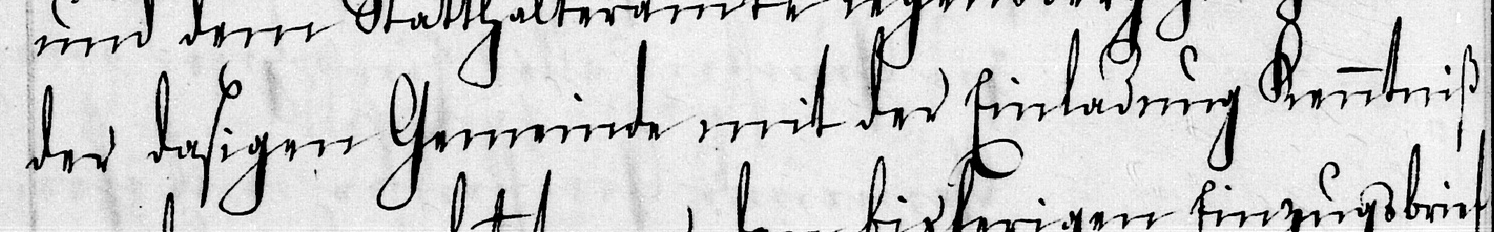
der dasigen Gemeinde mit der Einladung Kenntniß
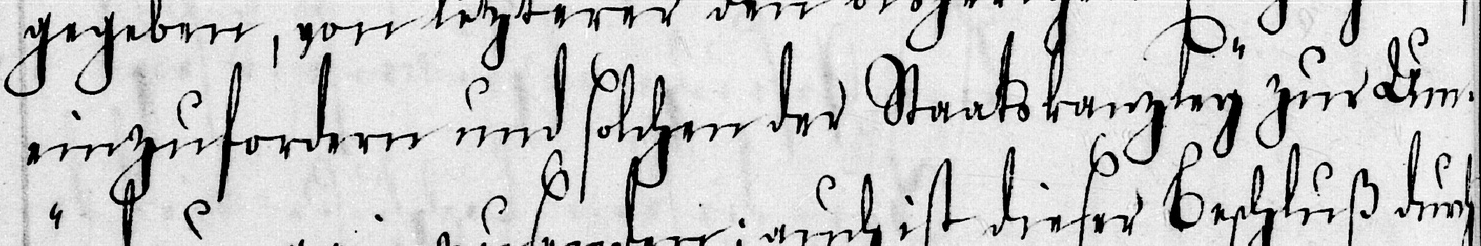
einzufordern und solchen der Staatskanzley zur Um¬
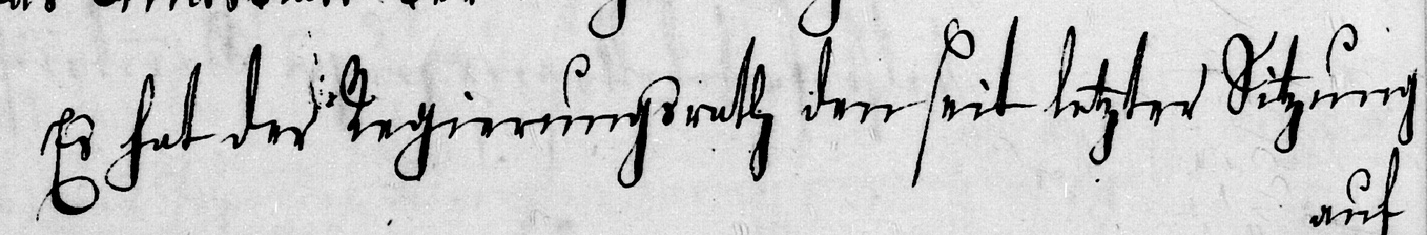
Es hat der Regierungsrath den seit letzter Sitzung
